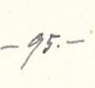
95.
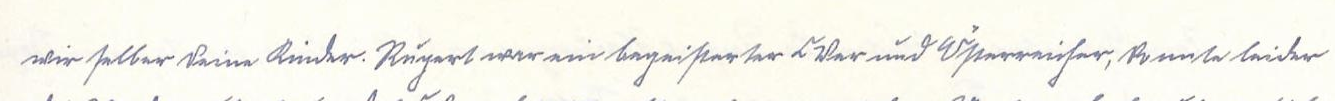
wir selber keine Kinder. Rupert war ein begeisterter CVer und Österreicher, konnte leider
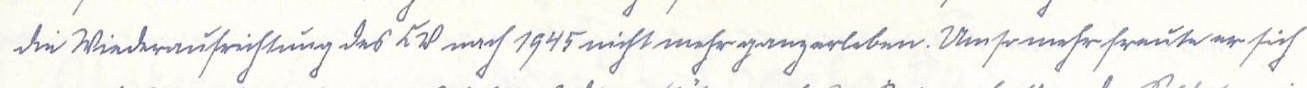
die Wiederaufrichtung des CV nach 1945 nicht mehr ganz erleben. Um so mehr freute er sich
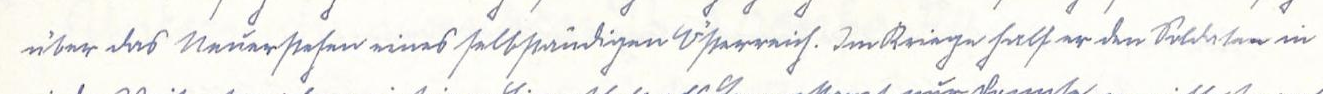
über das Neuerstehen eines selbständigen Österreich. Im Kriege half er den Soldaten in
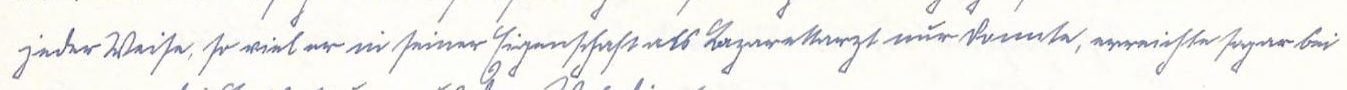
jeder Weise, so viel er in seiner Figenschaft als Lazarettarzt nur konnte, erreichte sogar bei
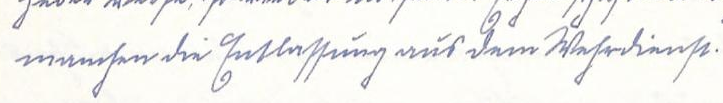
manchen die Entlassung aus de Wehrdienst
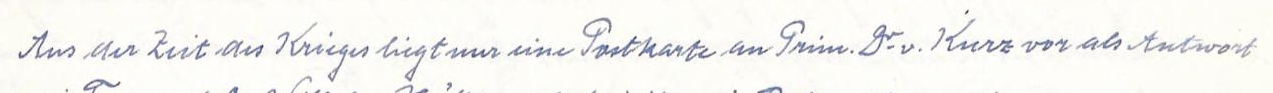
Aus der Zeit des Krieges liegt nur eine Postkarte an Prim. Dr. v. Kurz vor als Antwort
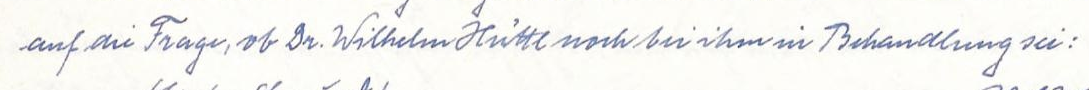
auf die Frage, ob Dr. Wilhem Hüttl noch bei ihm in Behandlung sei:
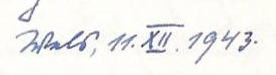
Wels, 11. 2. 1943.
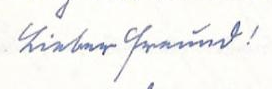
Lieber Freund!
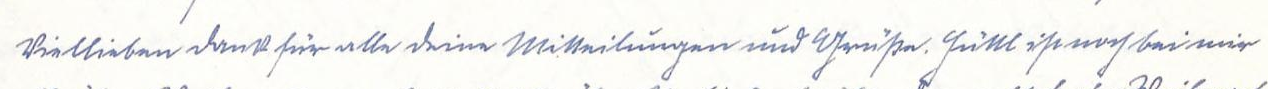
Viellieben Dank für alle deine Mitteilungen und Grüße. Hüttl ist noch bei mir
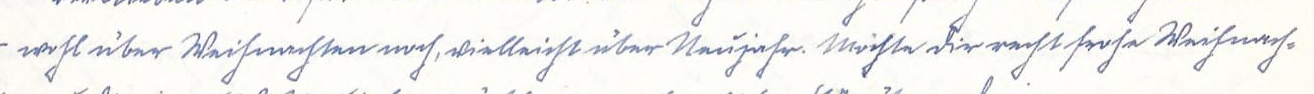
wohl über Weihnachten noch, vielleicht über Neujahr. Möchte dir recht frohe Weihnach-
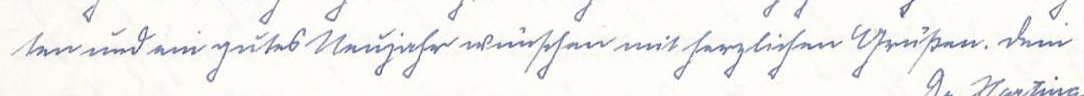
ten und ein gutes Neujahr wünschen mit herzlichen Grüßen. Dein
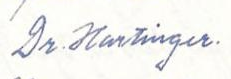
Dr Hartinger.
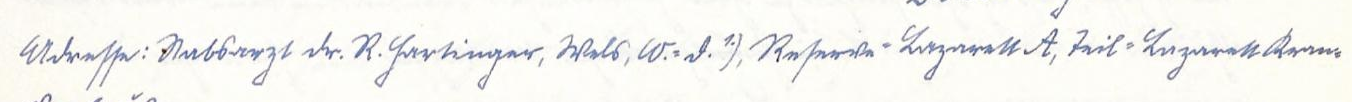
Adresse: Stabsarzt Dr. R. Hartinger, Wels, O.D.. 1), Reserve-Lazarett , Teil-Lazarett Krank-
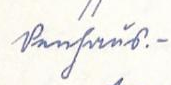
kenhaus.-
